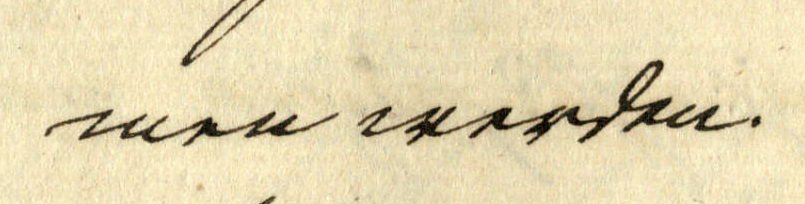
men werden
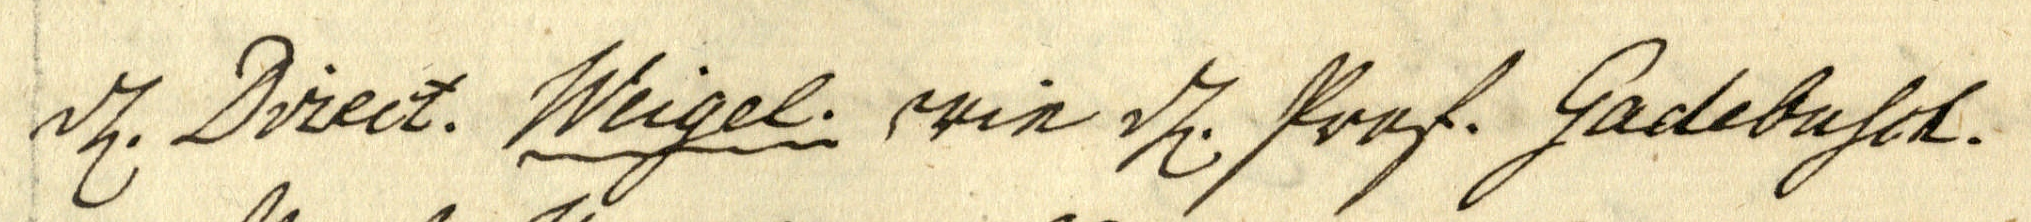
dh. Direct. Weigel. wie dh. Prof. Gadebusch.
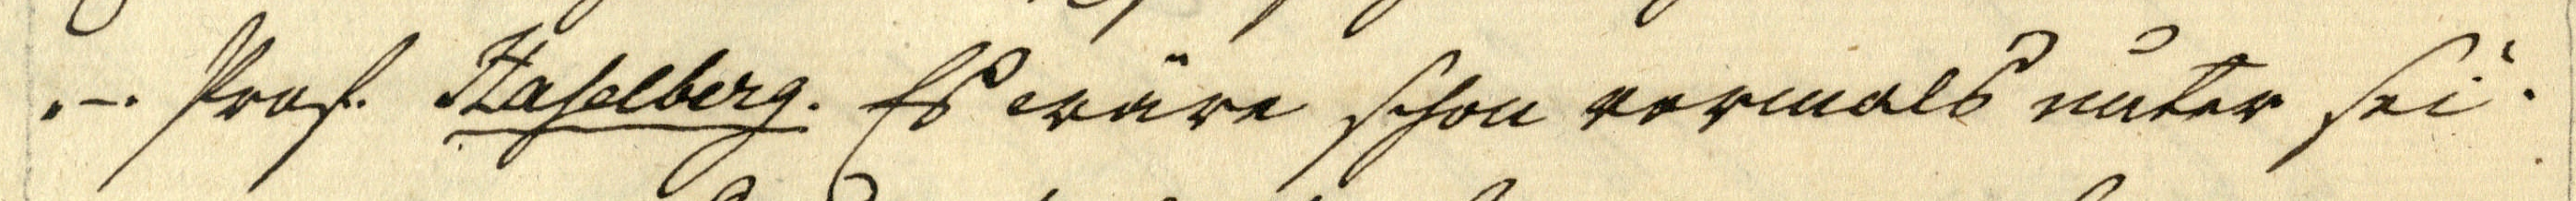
" - " Prof. Haselberg. Es wäre schon vormals unter sei-
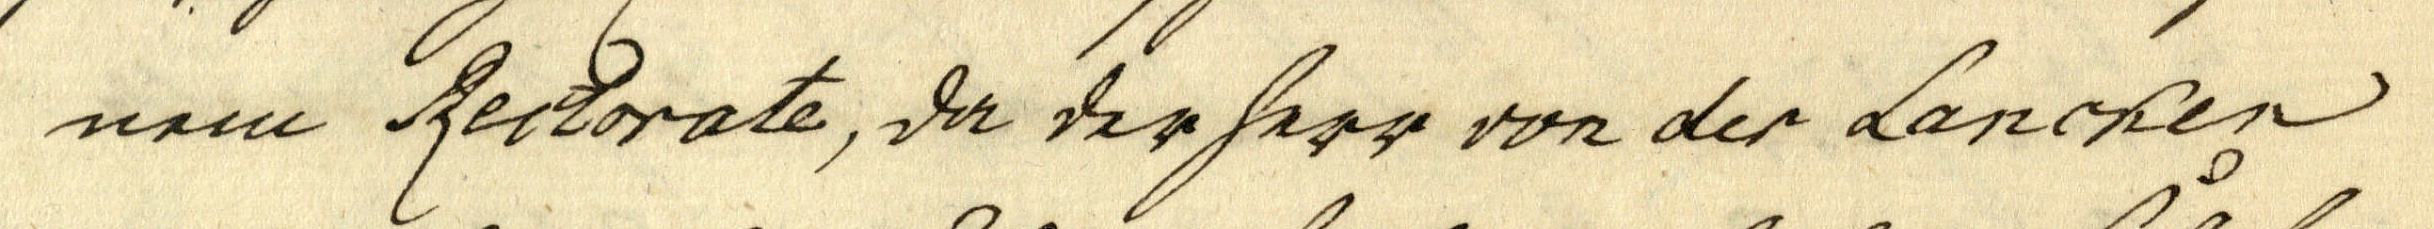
nem Rectorate, da der Herr von der Lancken
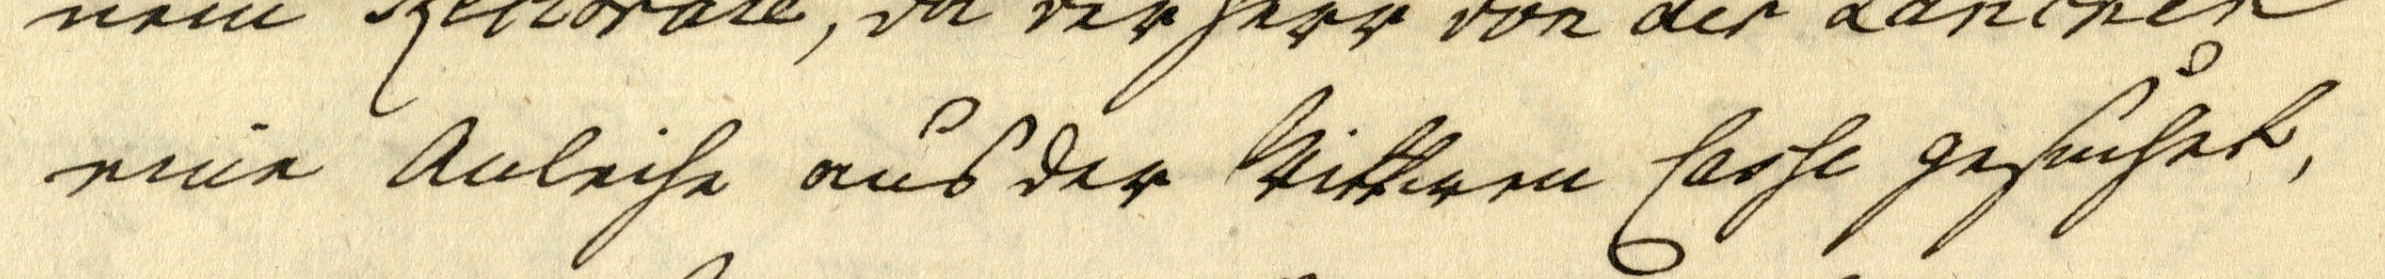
eine Anleihe aus der Wittwen Casse gesuchet,
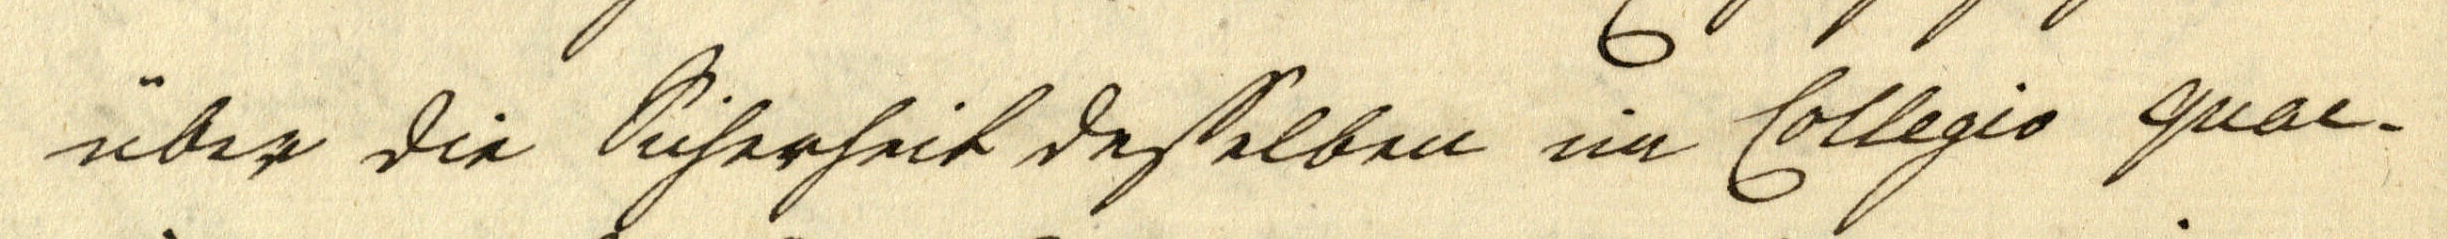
über die Sicherheit desselben im Collegio quae-
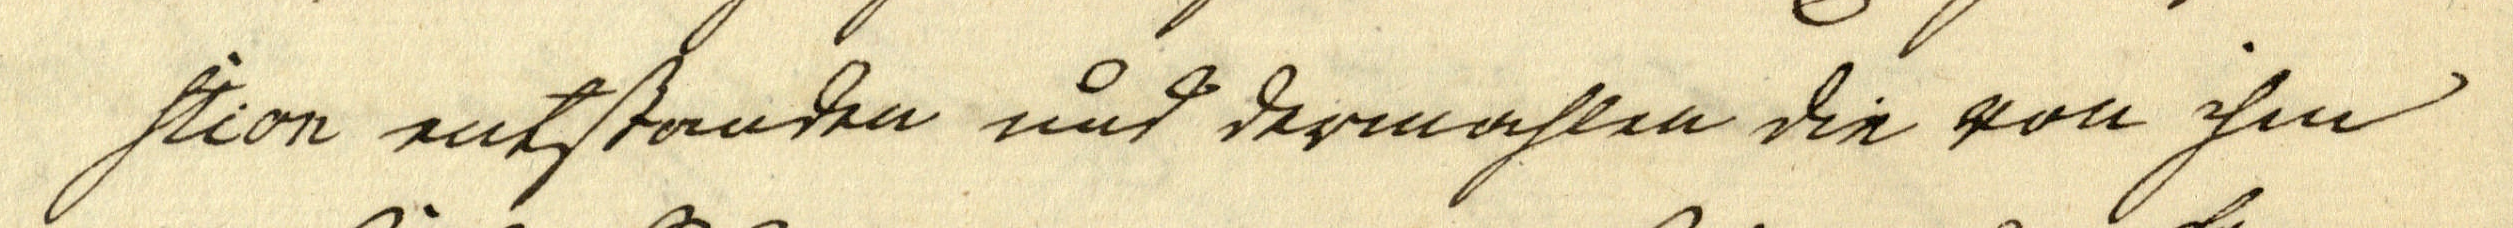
stion entstanden und dermahlen die von ihm
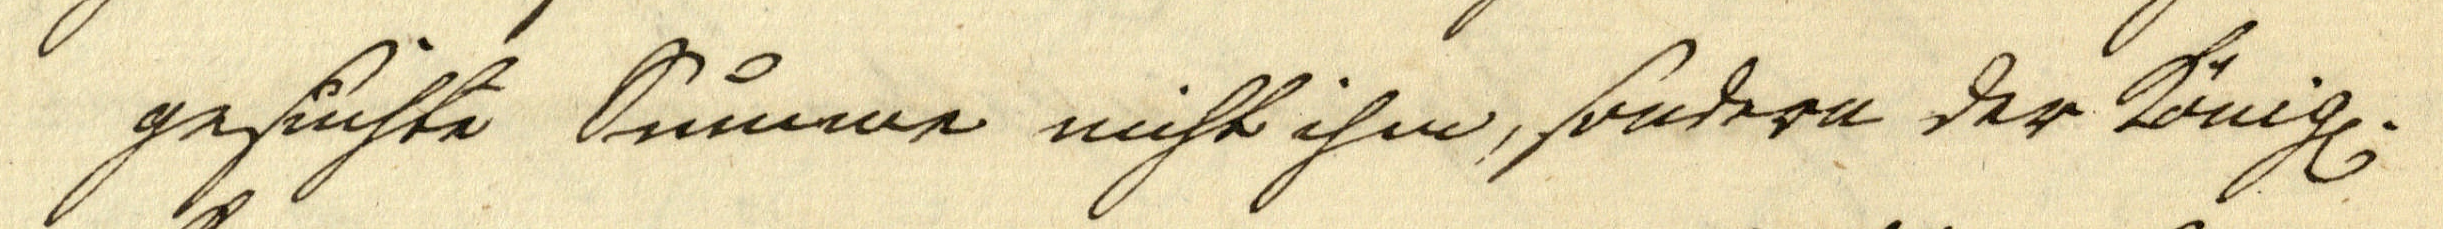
gesuchte Summe nicht ihm, sondern der Königl.
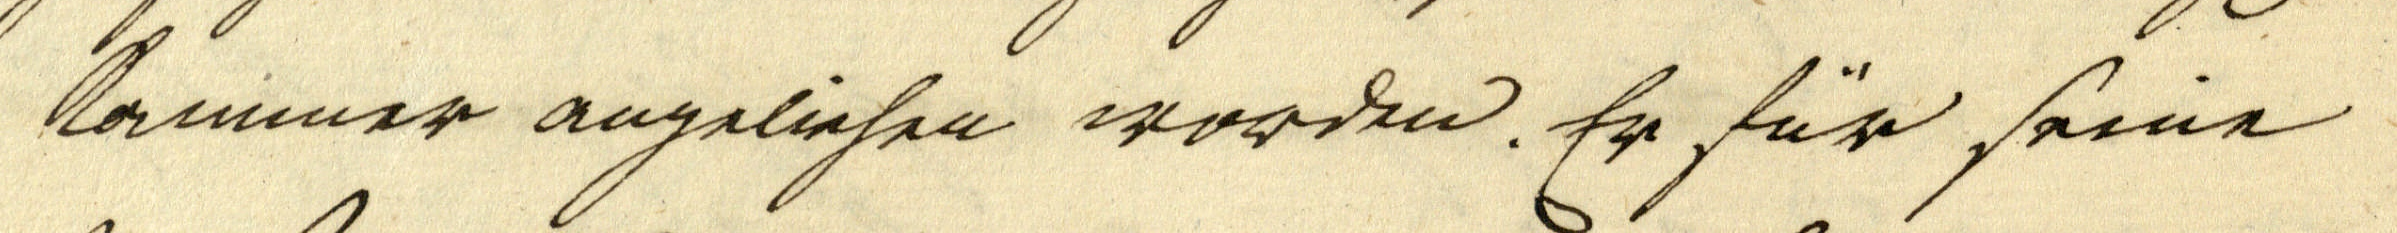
Kammer angeliehen worden. Er für seine
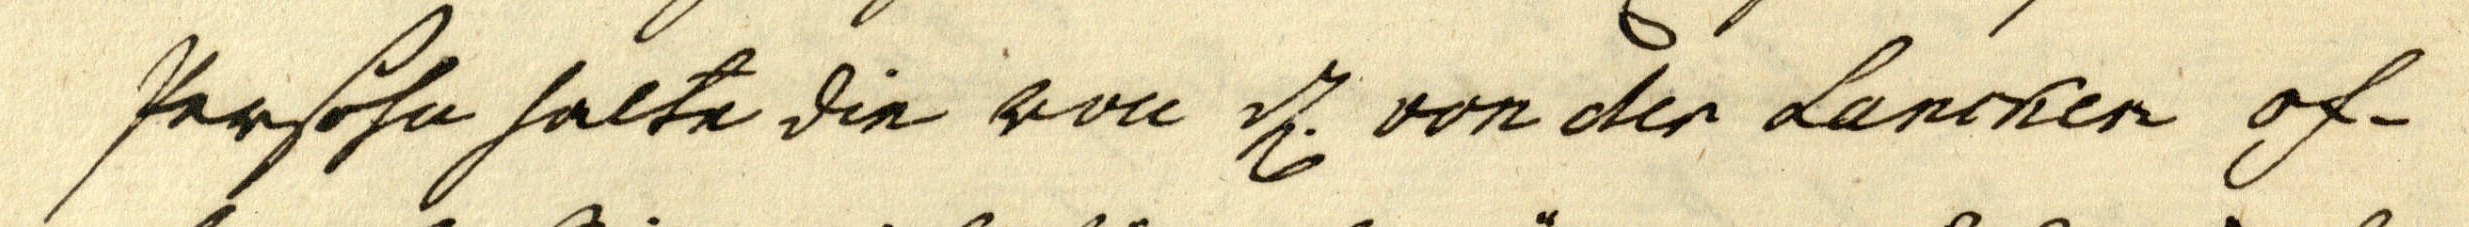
Persohn halte die von dh. von der Lancken of-
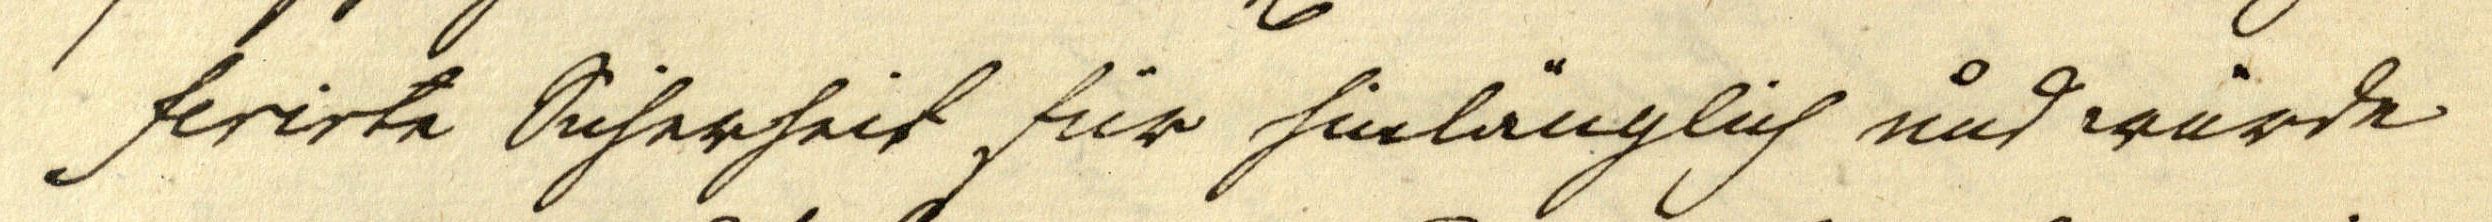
ferirte Sicherheit für hinlänglich und würde
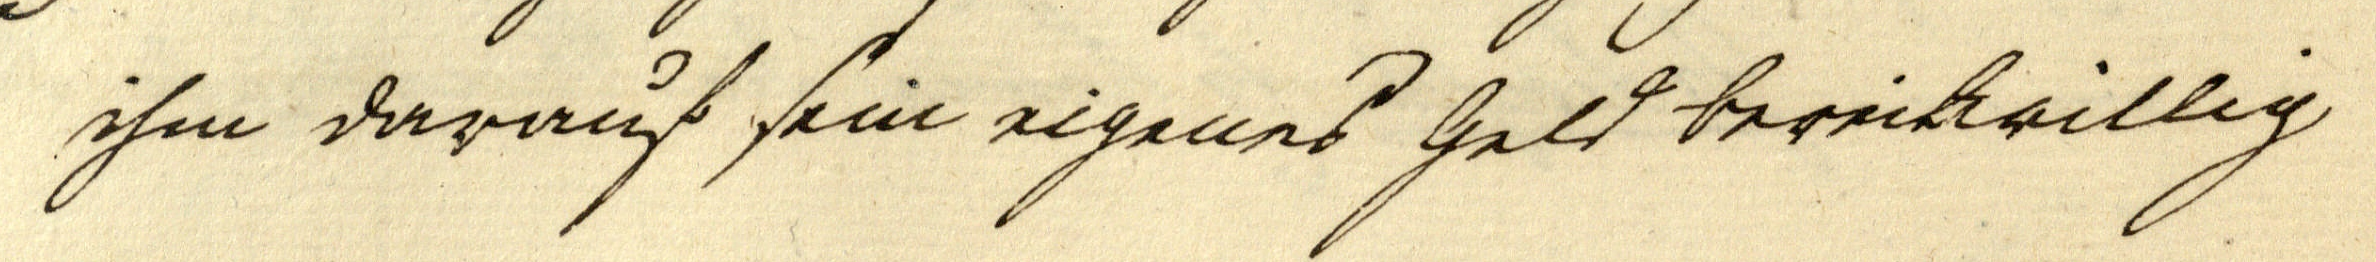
ihm darauf sein eigenes Geld bereitwillig
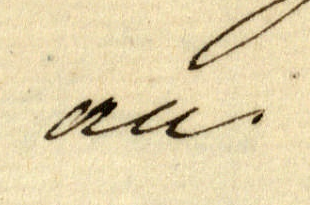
an-
